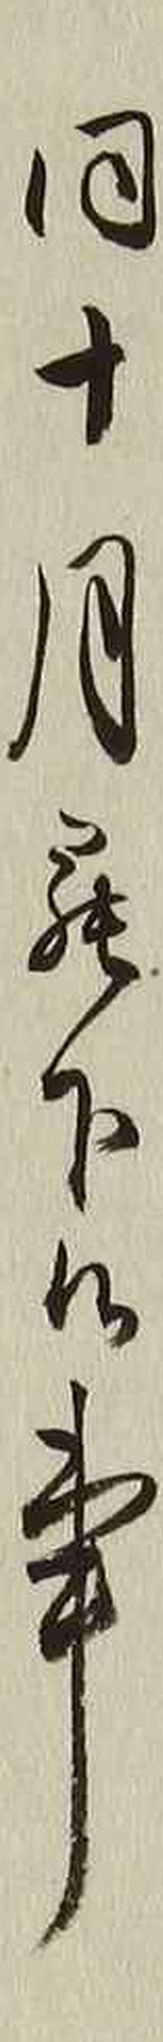同十月罷下候事
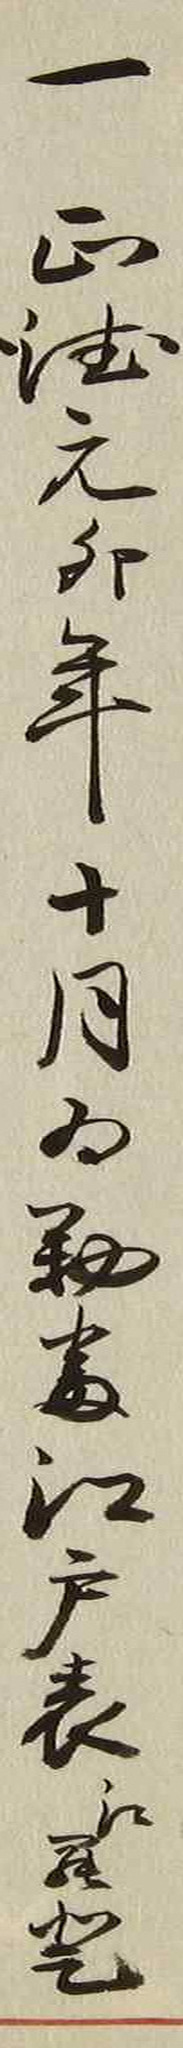一正徳元卯年十月為勤番江戸表江罷登
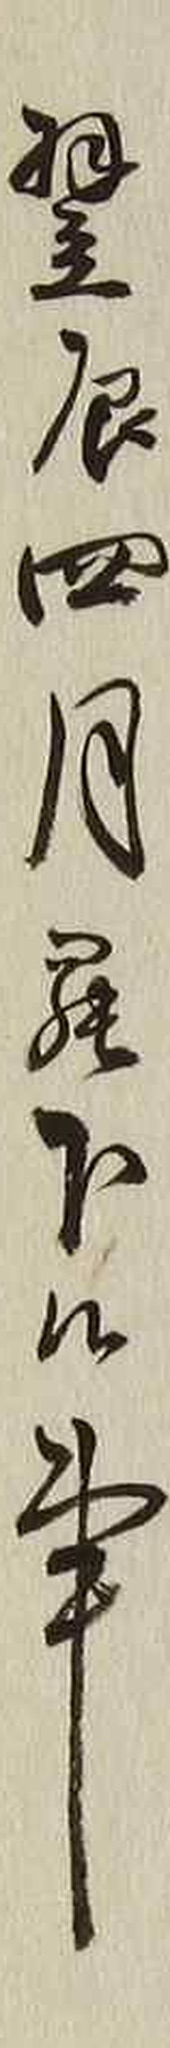翌辰四月罷下候事
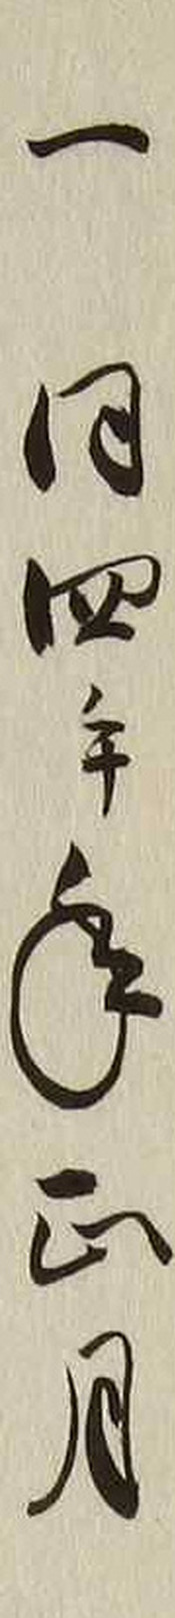一同四午年正月
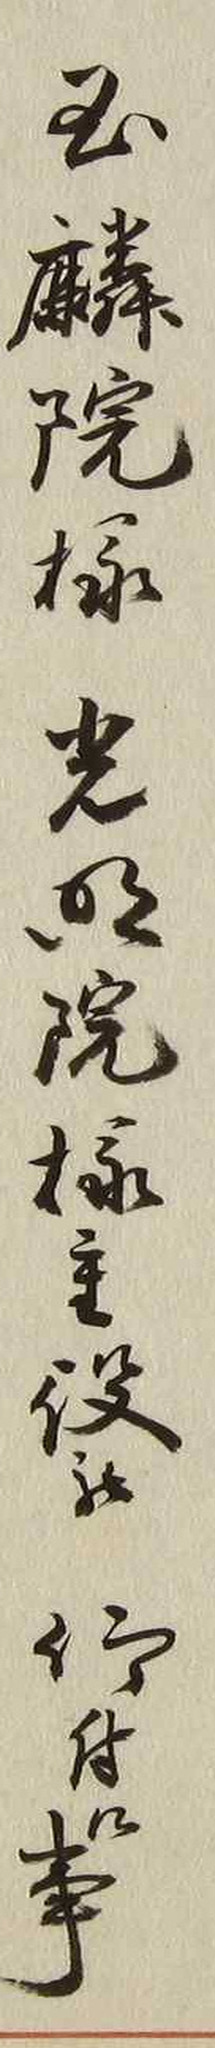玉麟院様光明院様重役被仰付候事
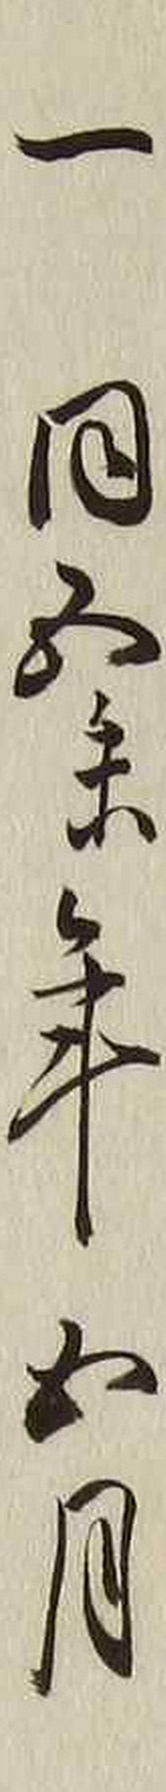一同五未年五月
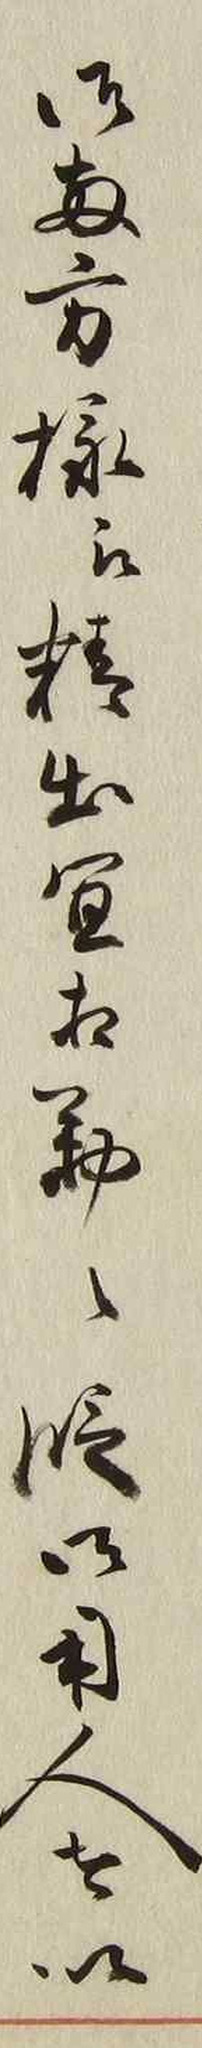御両方様江精出宜相勤候段御用人を以
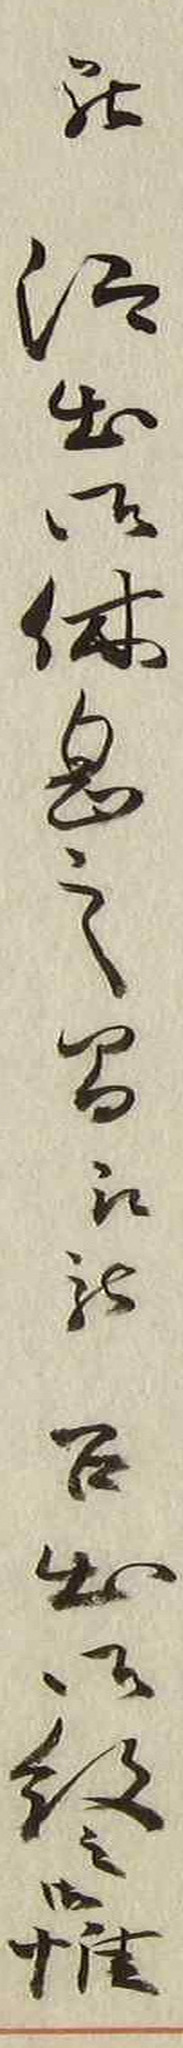被仰出御休息之間江被召出御紋之御帷
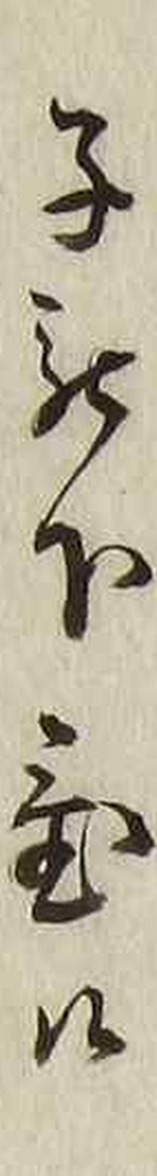子被下置候
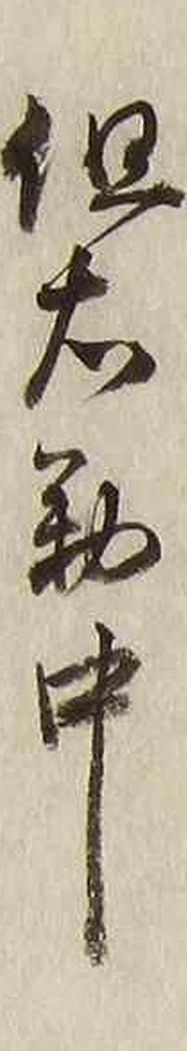但右勤中
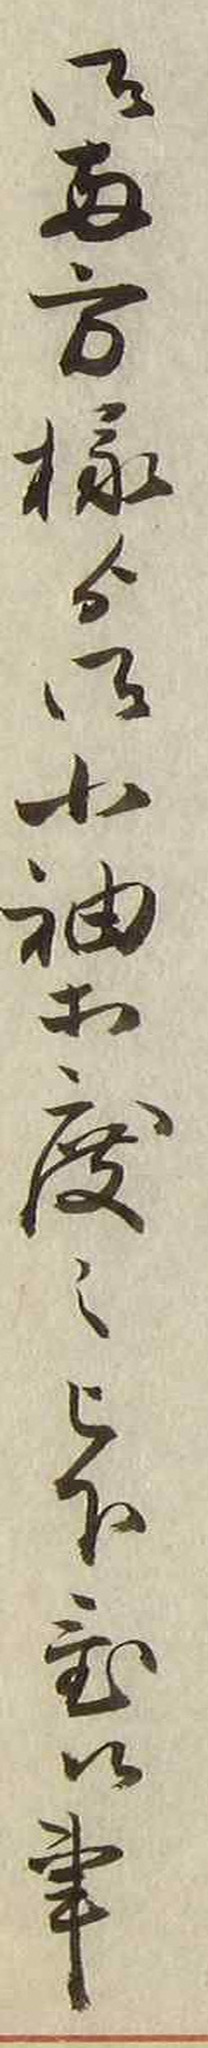御両方様ゟ御小袖等度々被下置候事

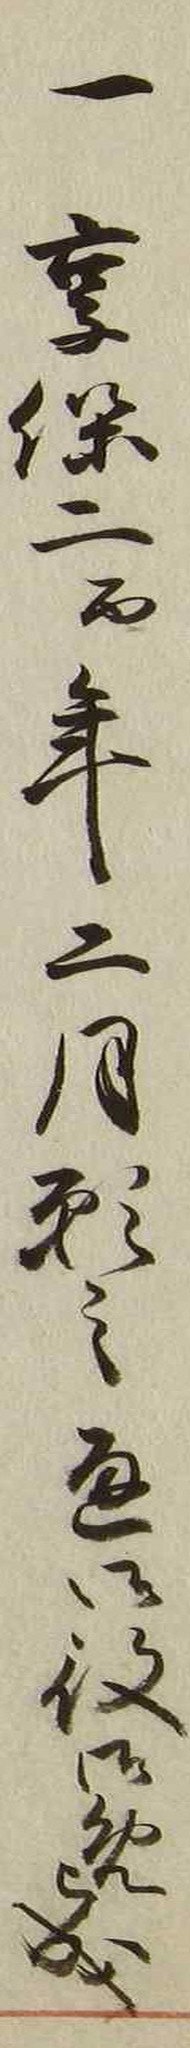一享保二酉年二月願之通御役御免被成
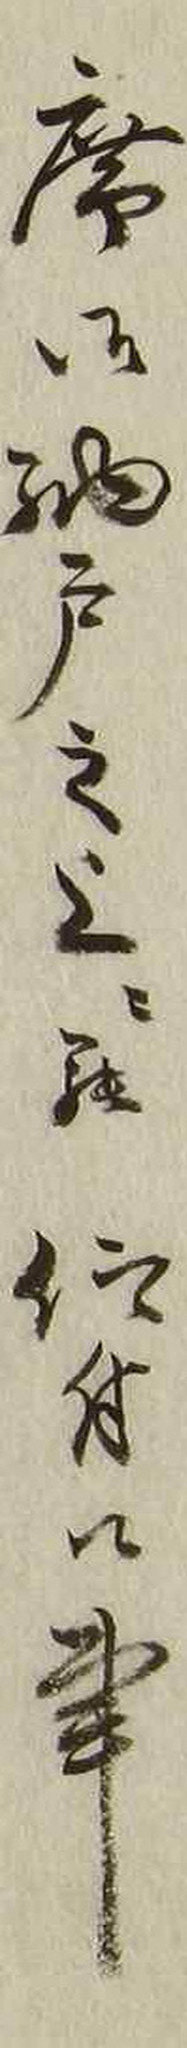席御納戸之上ニ罷仰付候事
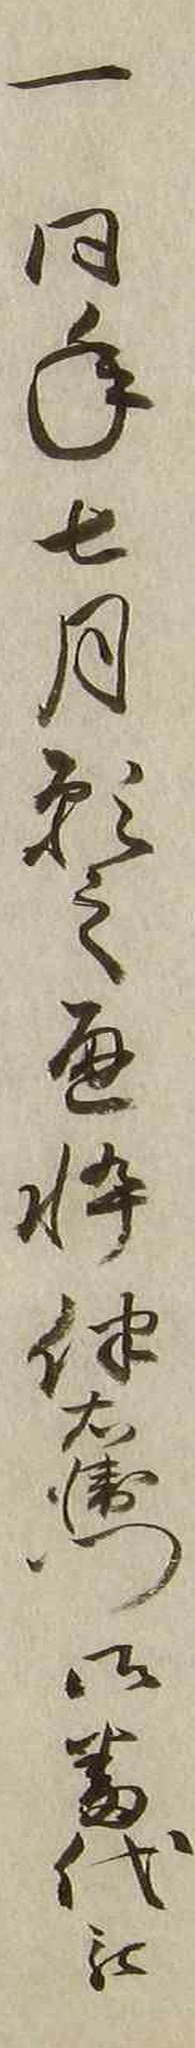一同年七月願之通忰伴右衛門御番代被
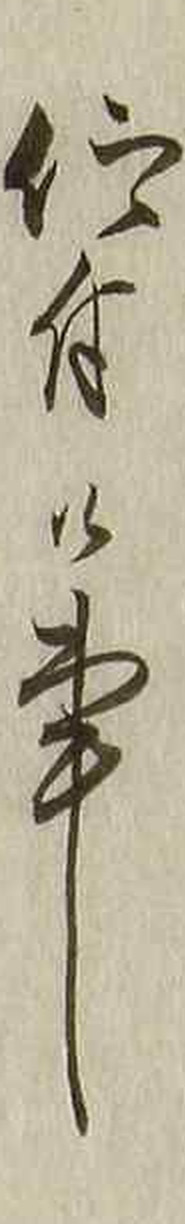仰付候事
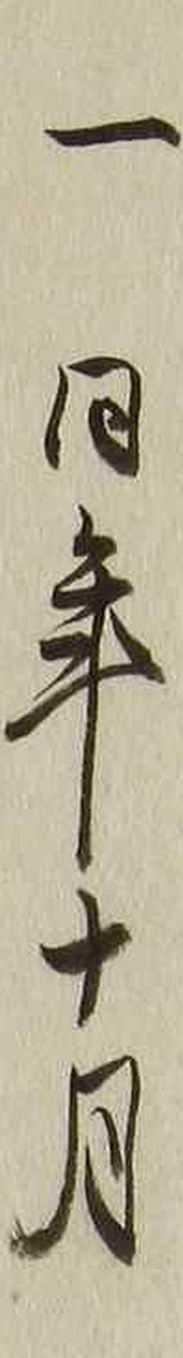一同年十月
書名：諸士系譜　巻之15　い之部15
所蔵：会津若松市立会津図書館
